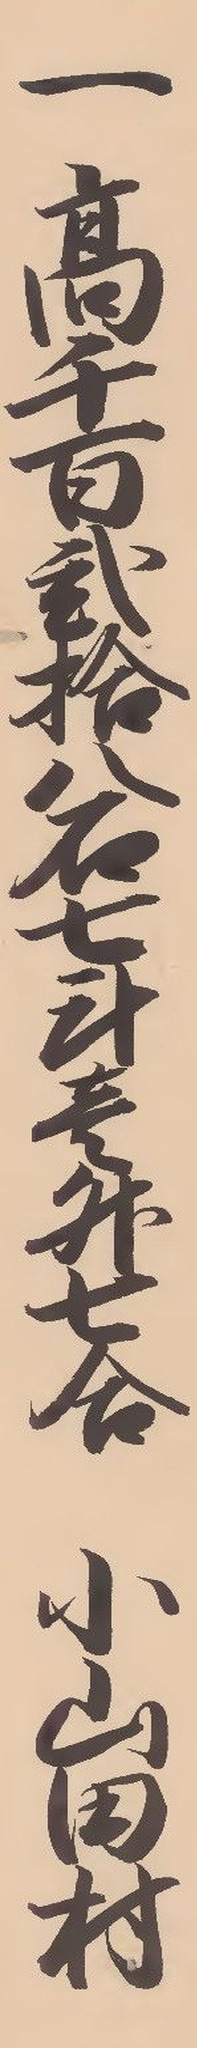一高千百弐拾八石七斗壱升七合小山田村

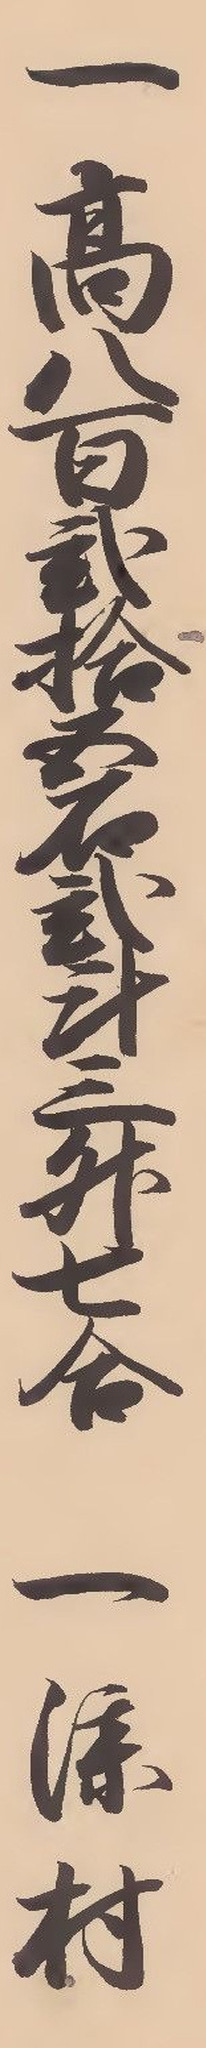一高八百弐拾五石弐斗三升七合一漆村
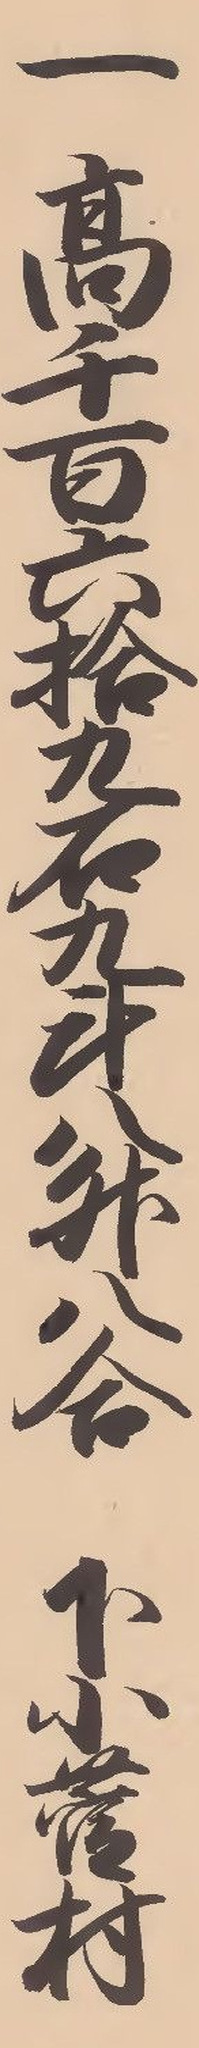一高千百六拾九石九斗八升八合下小菅村
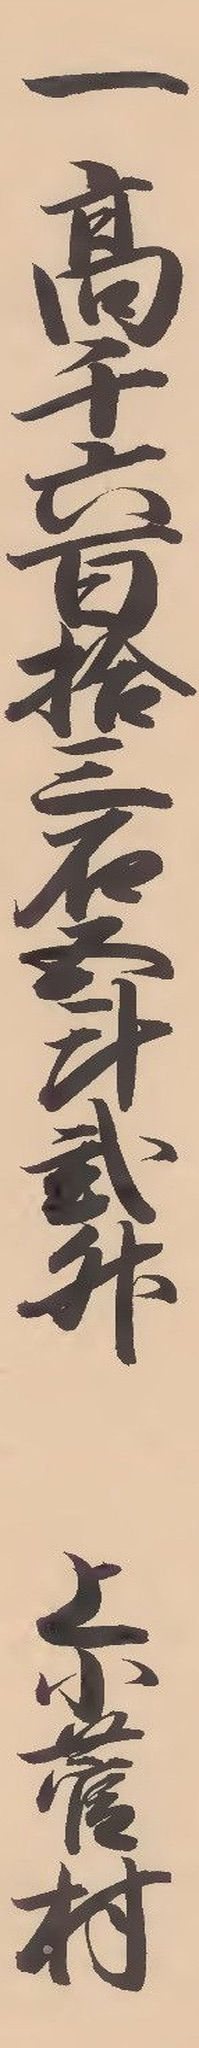一高千六百拾三石五斗弐升上小菅村
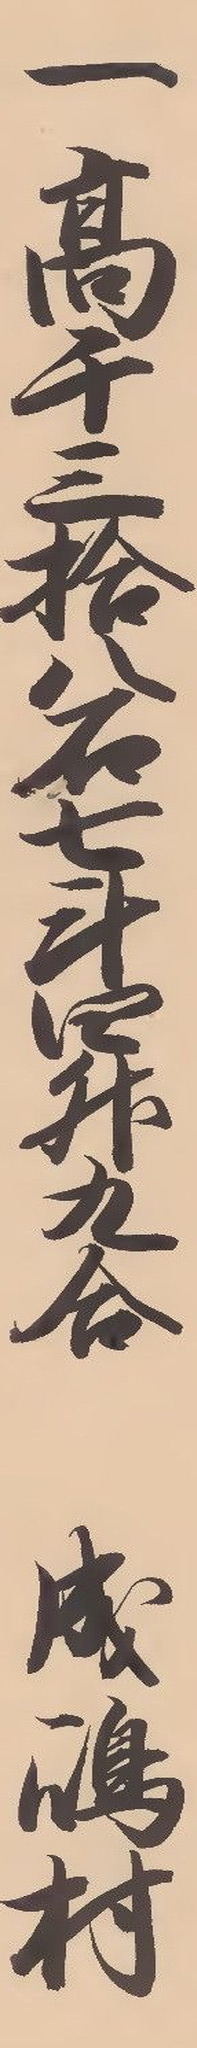一高千三拾八石七斗四升九合成島村
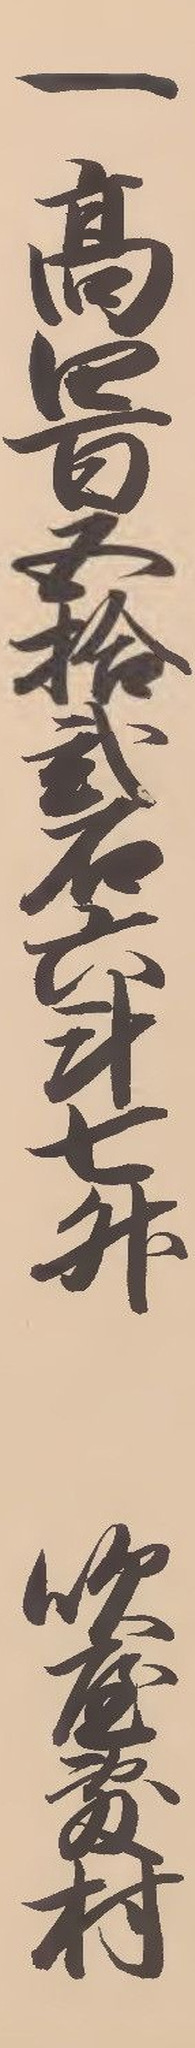一高四百五拾弐石六斗七升吹屋敷村
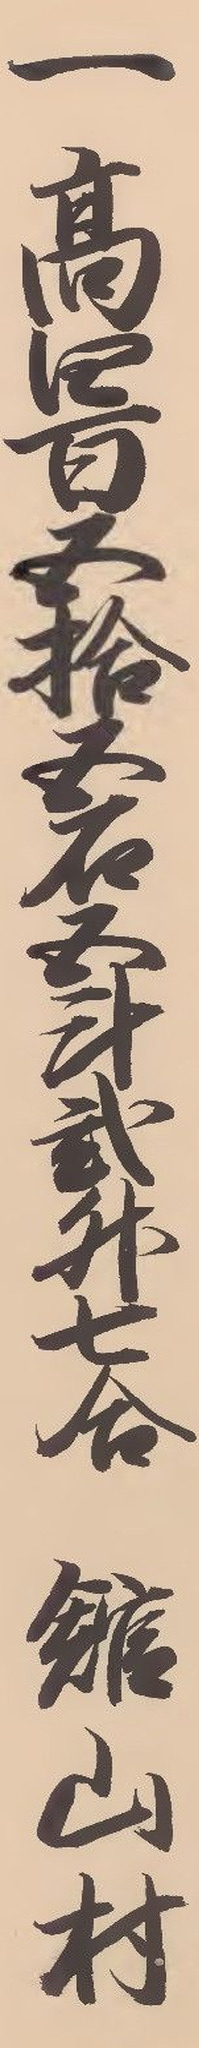一高四百五拾五石五斗弐升七合舘山村
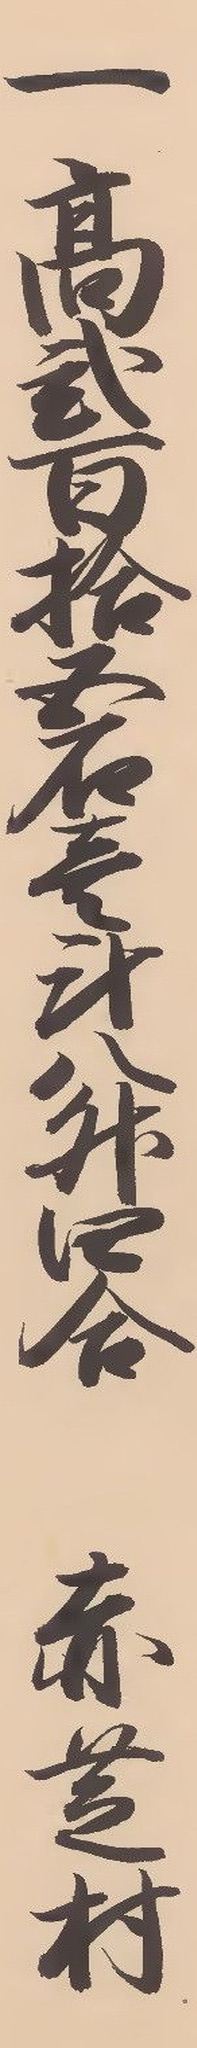一高弐百拾五石壱斗八升四合赤芝村
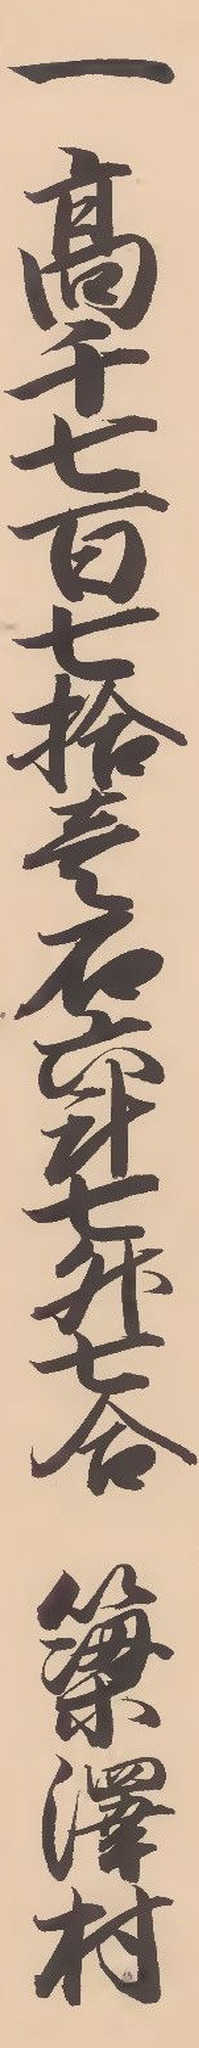一高千七百七拾壱石六斗七升七合簗沢村

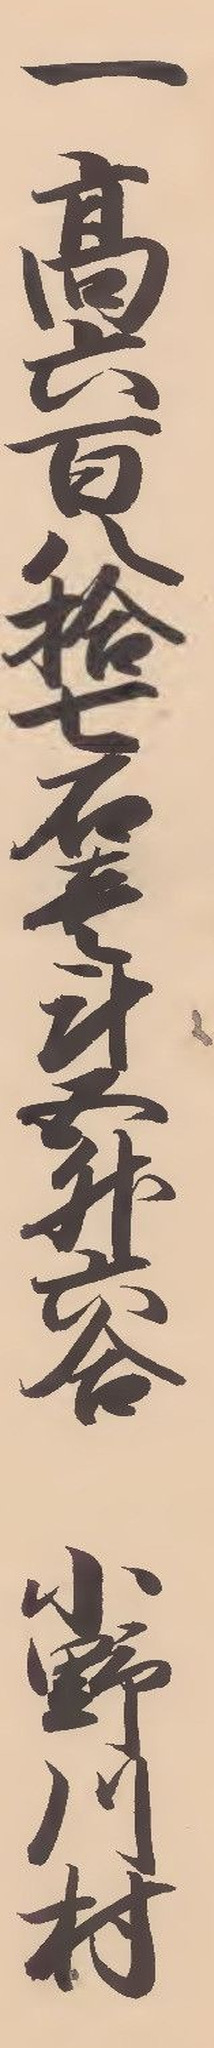一高六百八拾七石壱斗五升六合小野川村
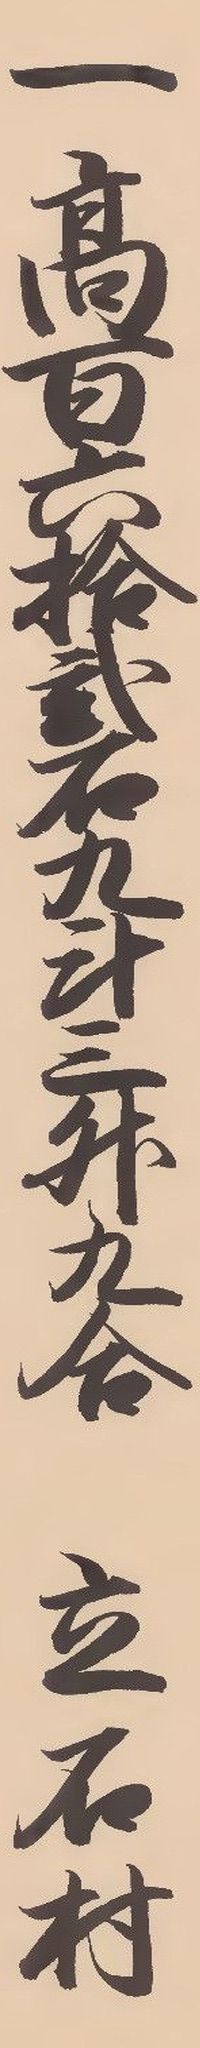一高百六拾弐石九斗三升九合立石村
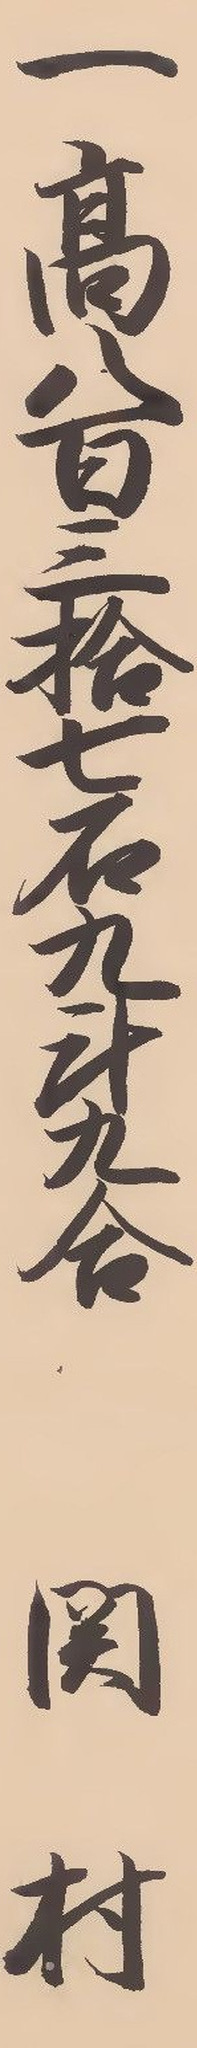一高八百三拾七石九斗九合関村
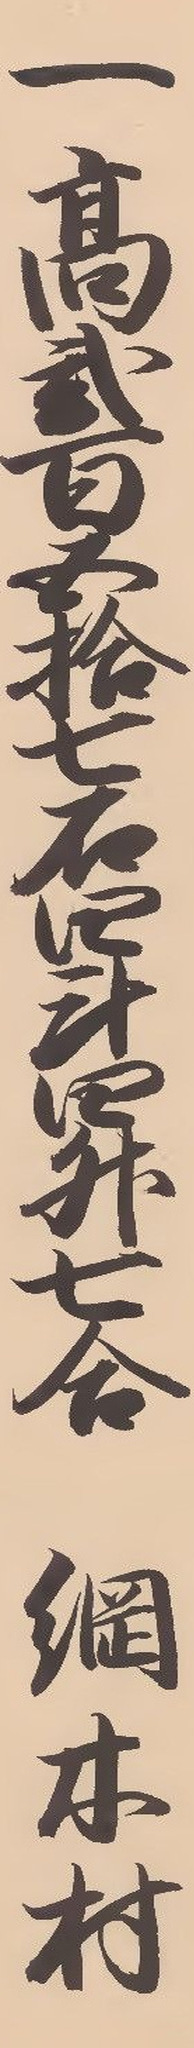一高弐百五拾七石四斗四升七合綱木村
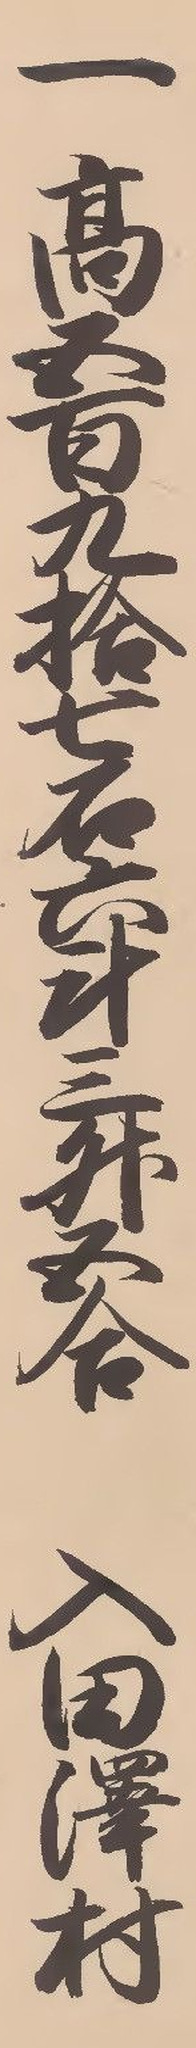一高五百九拾七石六斗三升五合入田沢村
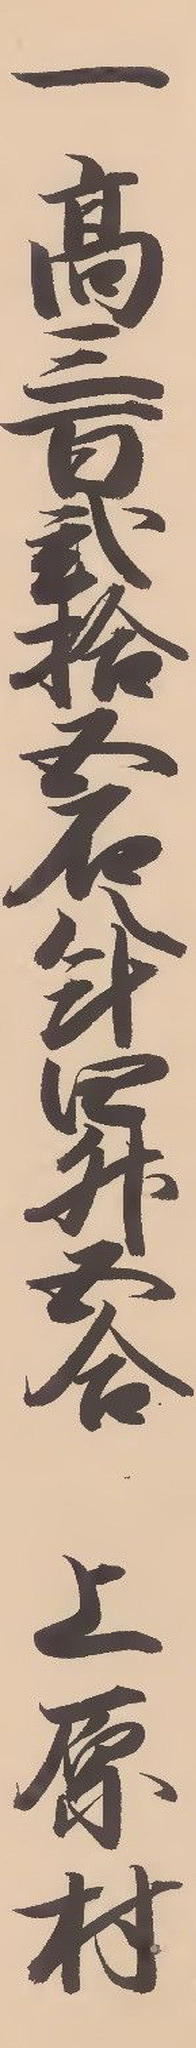一高三百弐拾五石八斗四升五合上原村
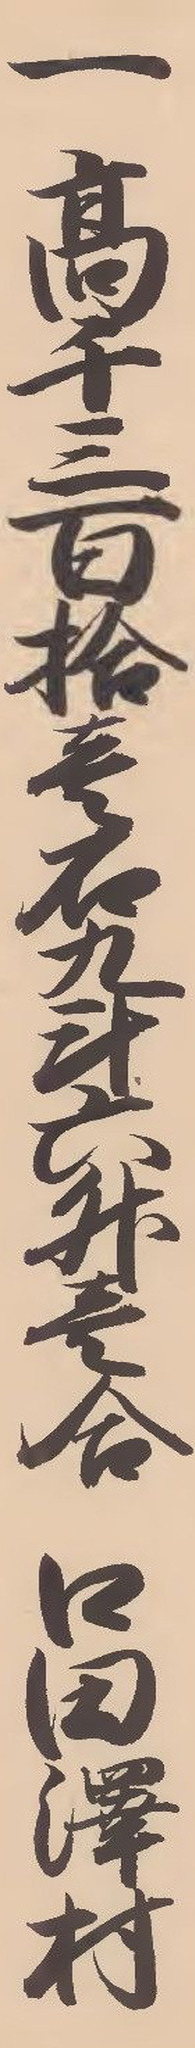一高千三百拾壱石九斗六升壱合口田沢村
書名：出羽国郷帳　１
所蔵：国立公文書館 National Archives of Japan
